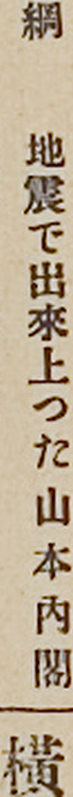横綱地震で出来上つた山本内閣
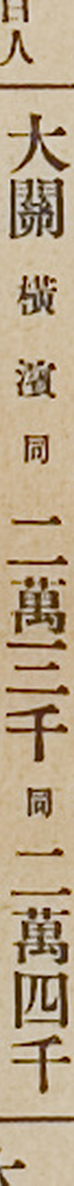大関横浜同二万三千同二万四千
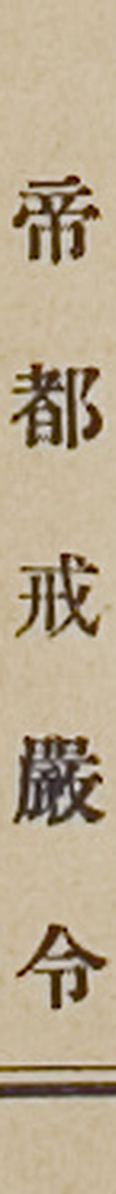横綱帝都戒厳令
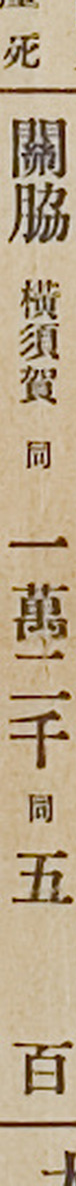関脇横須賀同一万二千同五百
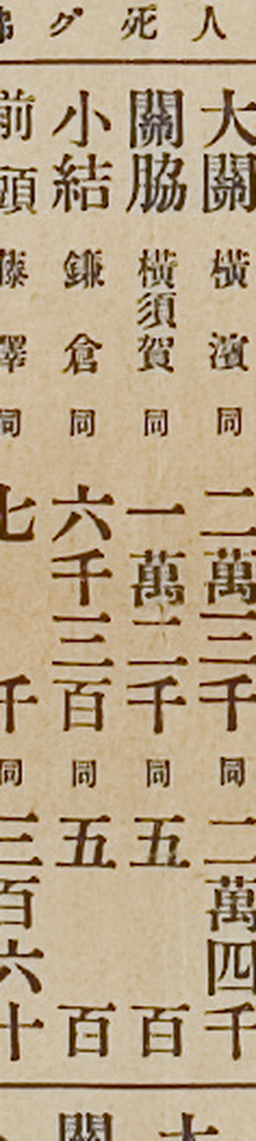関脇横須賀同一万二千同五百
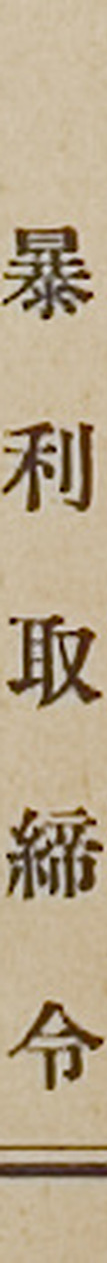関脇暴利取締令
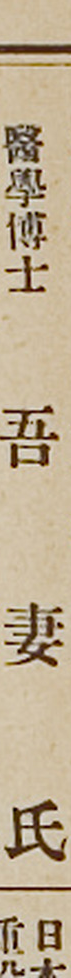医学博士吾妻氏
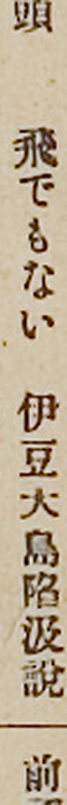前頭飛でもない伊豆大島陥没説
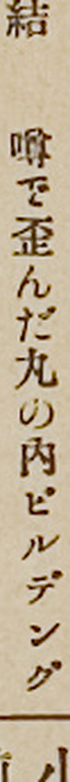小結噂で歪んだ丸の内ビルデング
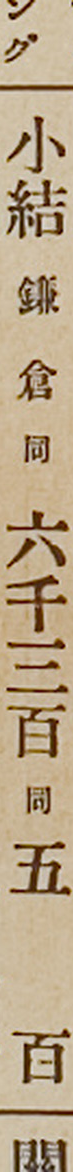小結鎌倉同六千三百同五百
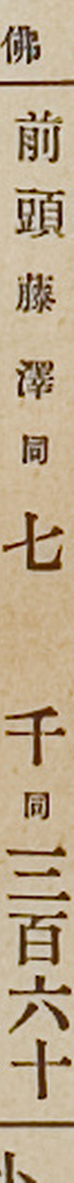前頭藤沢同七千同三百六十
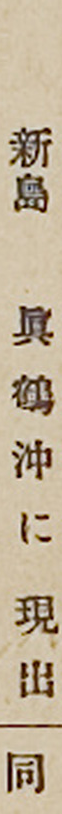同新島真鶴沖に現出
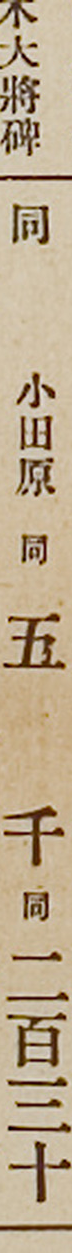同小田原同五千同二百六十
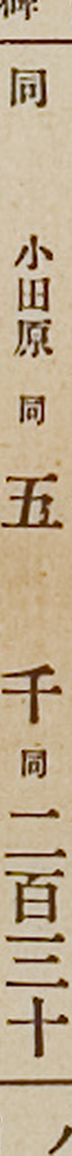同小田原同五千同二百六十
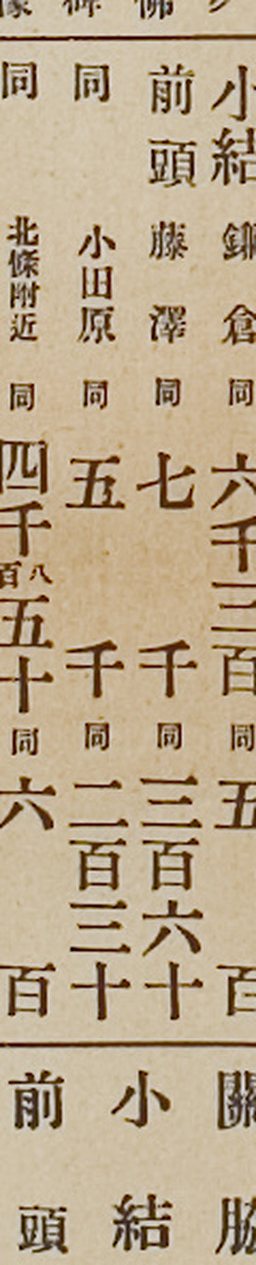同小田原同五千同二百六十
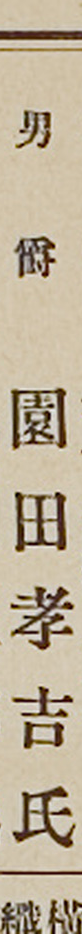男爵園田孝吉氏
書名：関東大震災大見立一覧表
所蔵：東京大学総合図書館 General Library in the University of Tokyo, JAPAN
